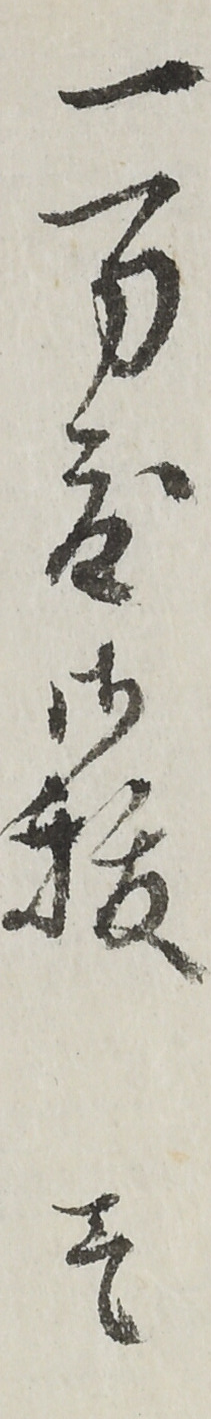一万度御祓壱
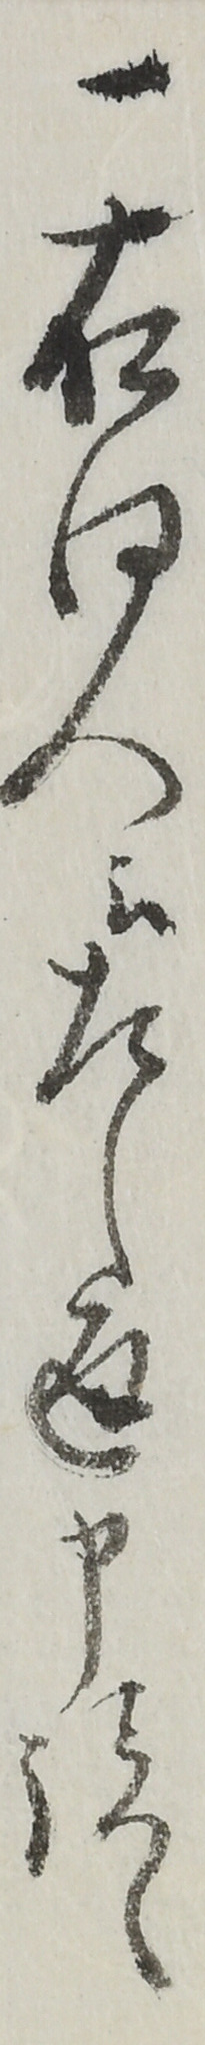一右同人江左之通申談候
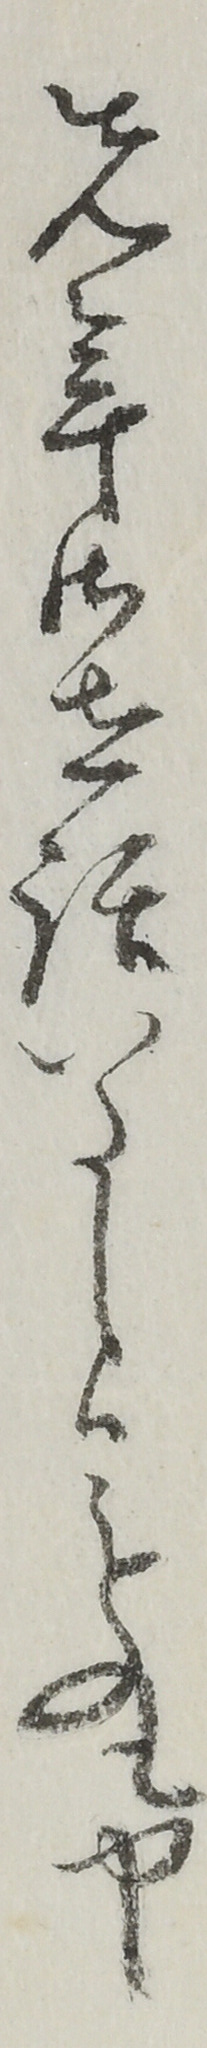先年お世話いたし候ものも申
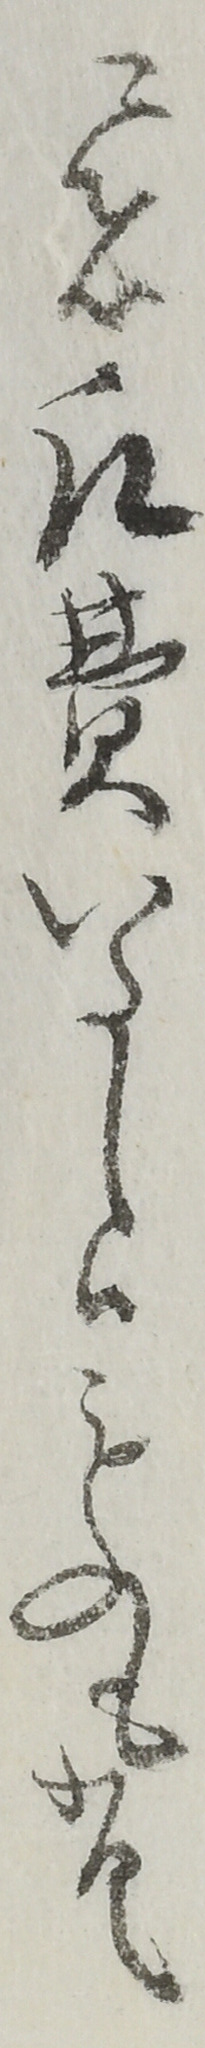ニ者凡費いたし候ものも有之
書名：山田大路御炊太夫様御泊諸事控
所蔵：伊那市立高遠町図書館・合同会社AMANE
